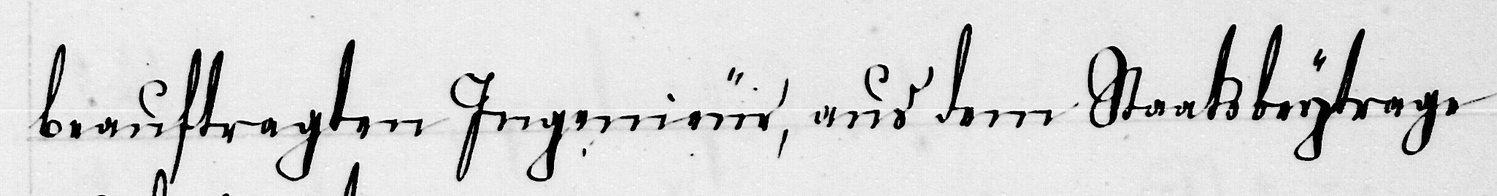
beauftragten Ingenieur, aus dem Staatsbeytrage
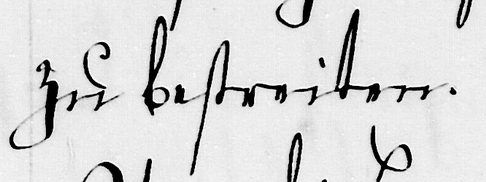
zu bestreiten.
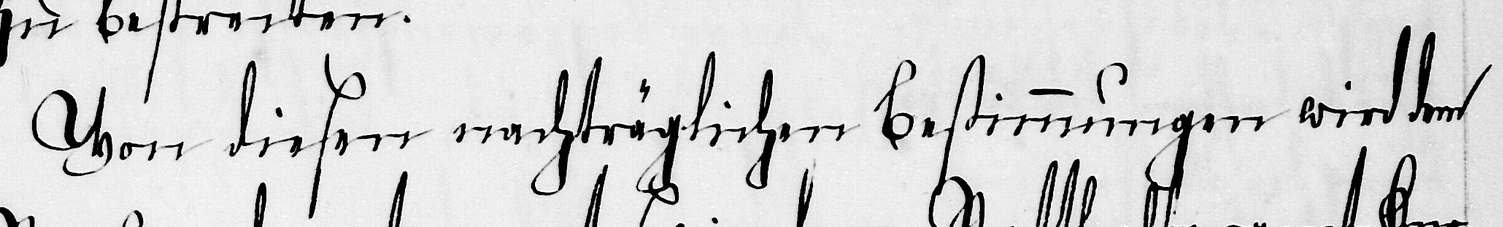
Von diesen nachträglichen Bestimmungen wird dem
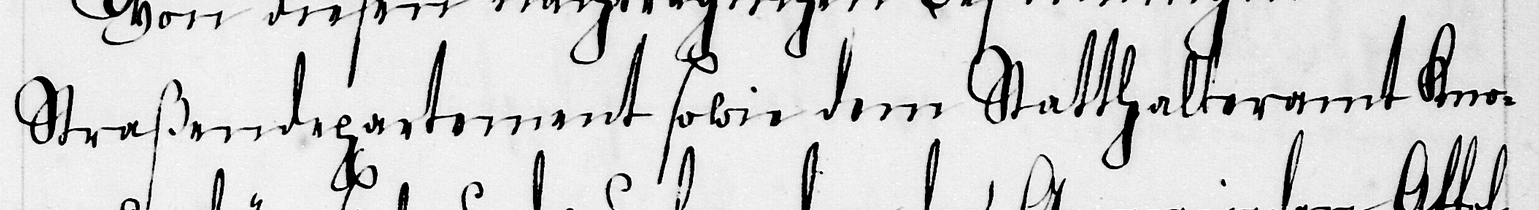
Straßendepartement sowie dem Statthalteramt Kno¬
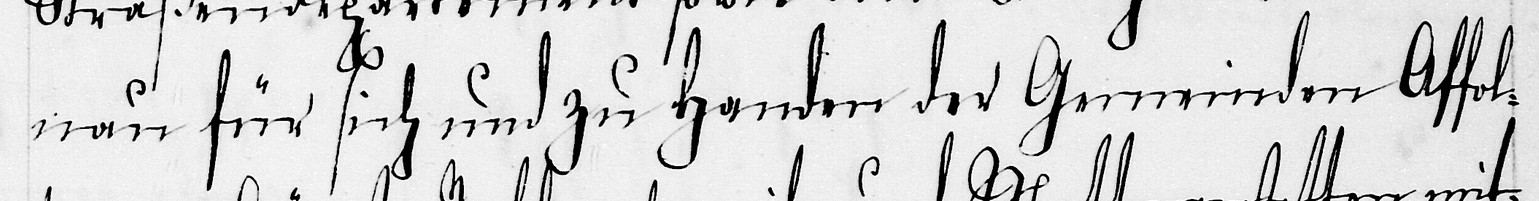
nau für sich und zu Handen der Gemeinden Affol¬
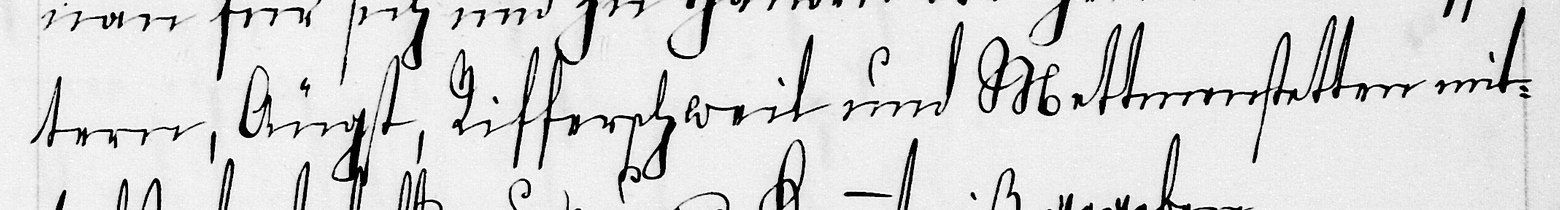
tern, Äugst, Rifferschweil und Mettmenstetten mit¬
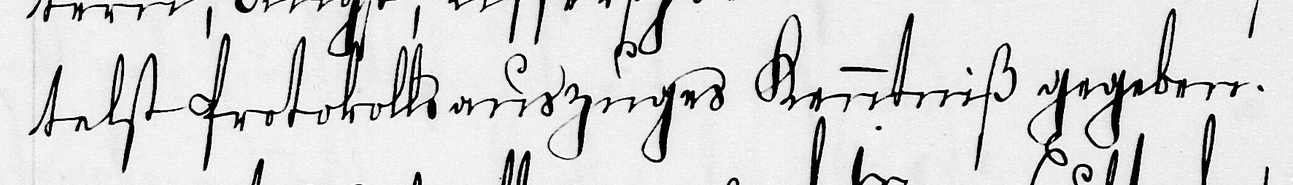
telst Protokollsauszuges Kenntniß gegeben.
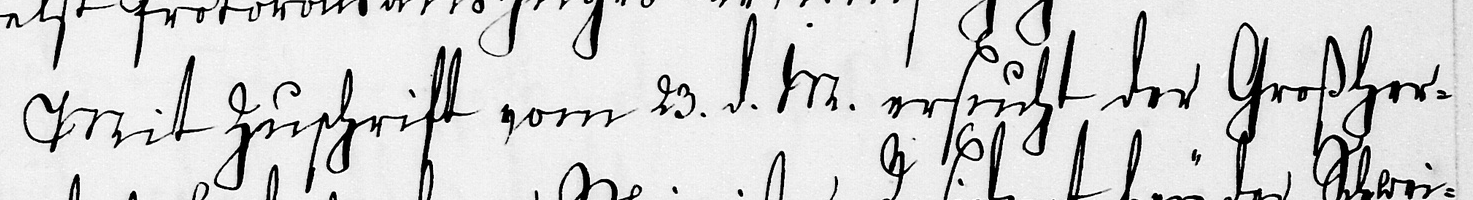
Mit Zuschrift vom 23. d. M. ersucht der Großher¬
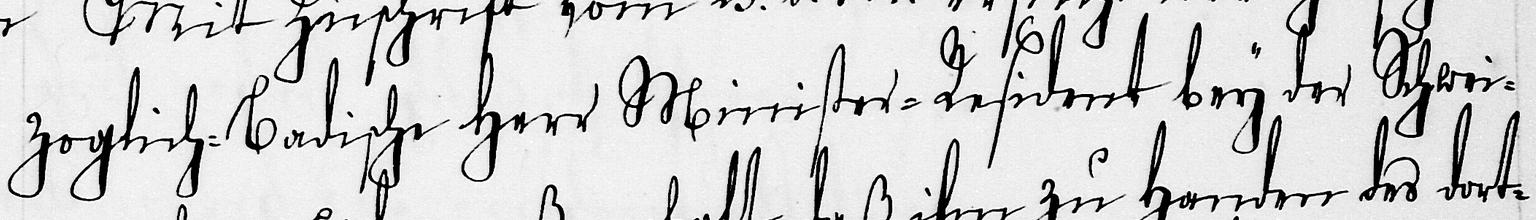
zoglich-Badische Herr Minister-Resident bey der Schwei¬
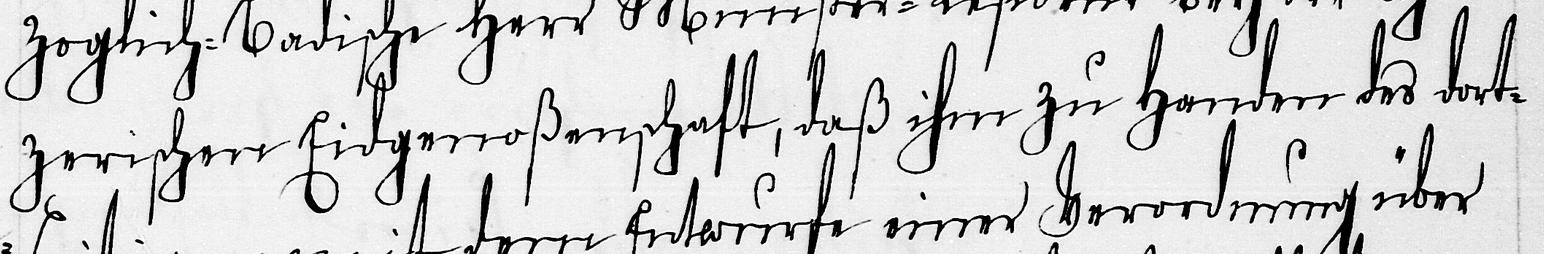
zerischen Eidgenoßenschaft, daß ihm zu Handen des dorts¬
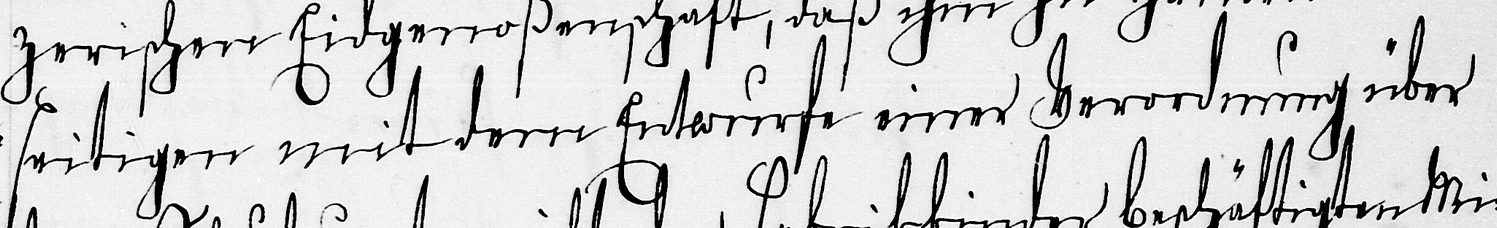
eitigen mit dem Entwurfe einer Verordnung über
